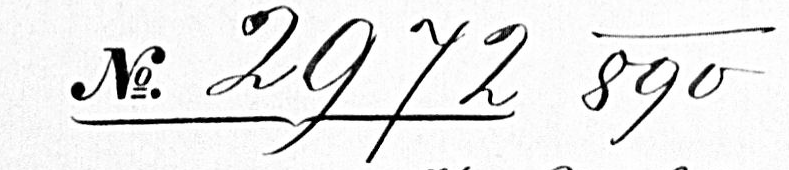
Nr. 2972 890
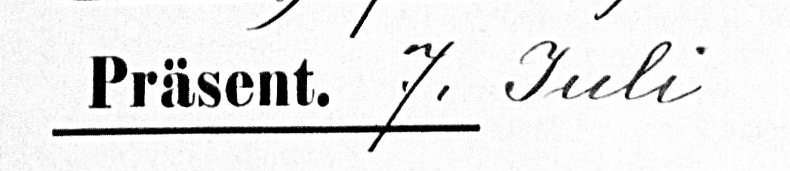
Präsent. 7. Juli
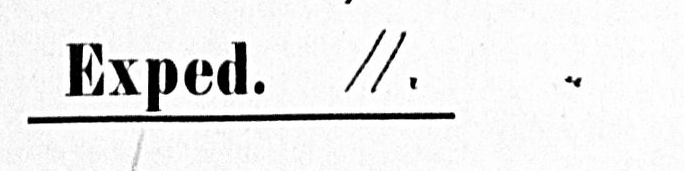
Exped. 11.
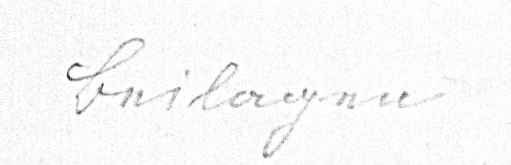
Beilagen
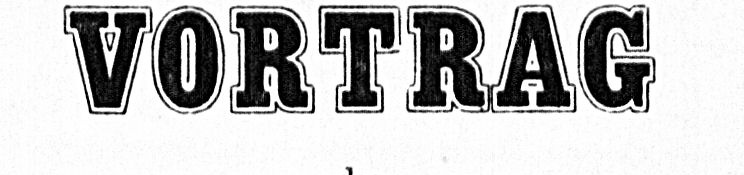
VORTRAG
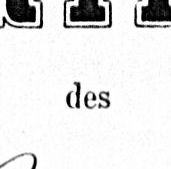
des
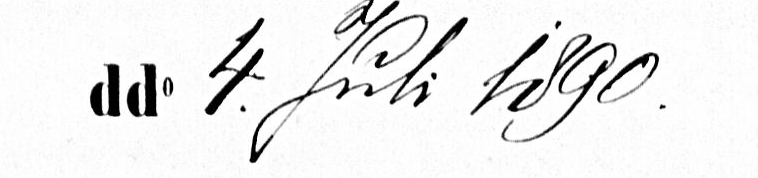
dd° 4. Juli 1890.
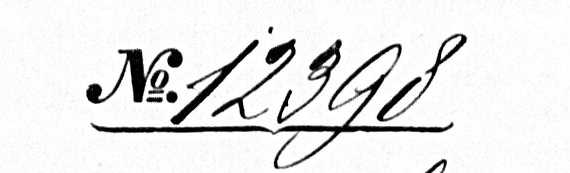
Nr. 12398
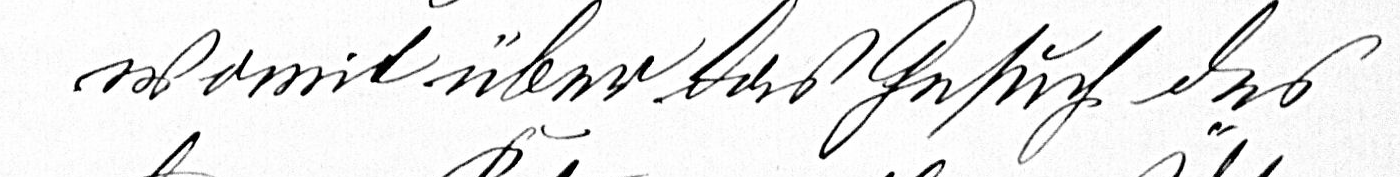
womit über das Gesuch
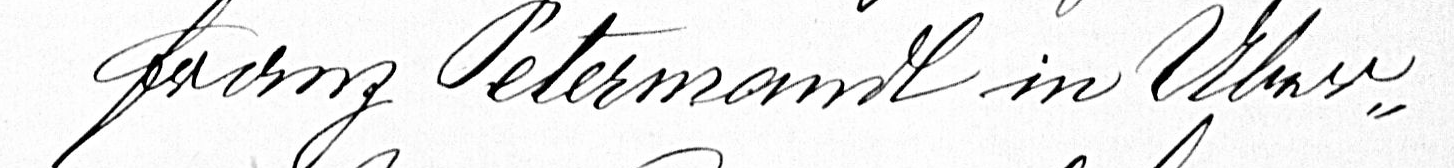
Franz Petermandl in Über¬
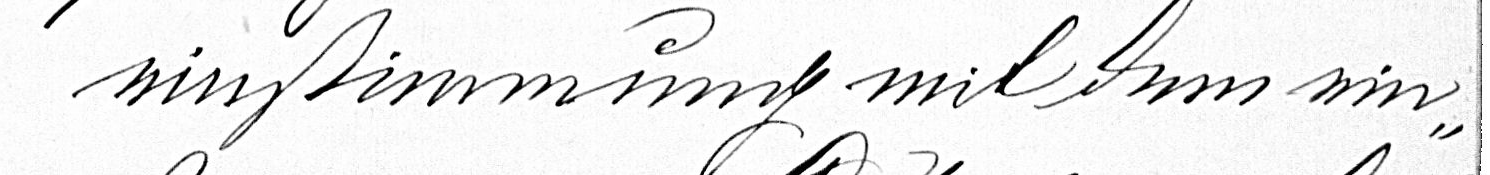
einstimmung mit dem ein¬
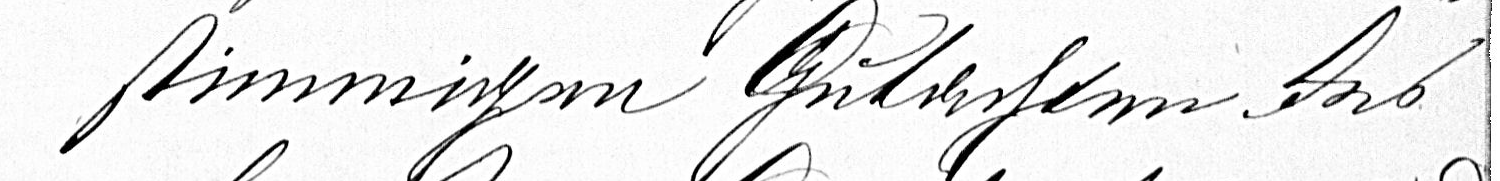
stimmigen Gutachten des
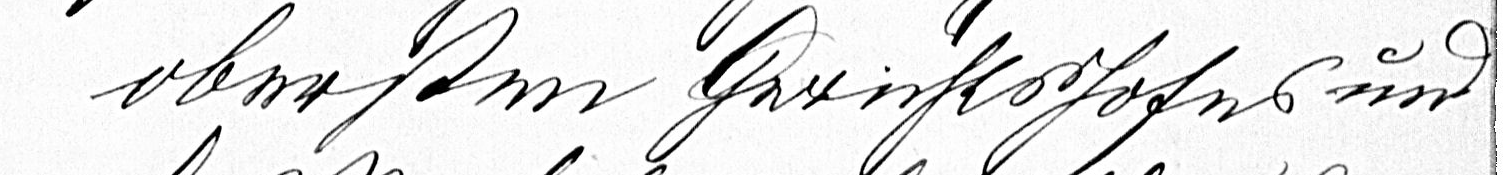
obersten Gerichtshofes und
